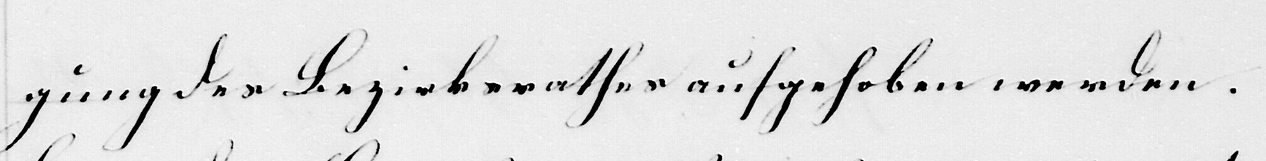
gung des Bezirksrathes aufgehoben werden.
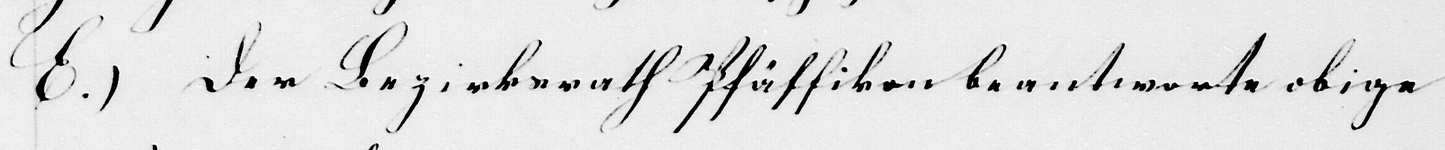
E.) Der Bezirksrath Pfäffikon beantworte obige
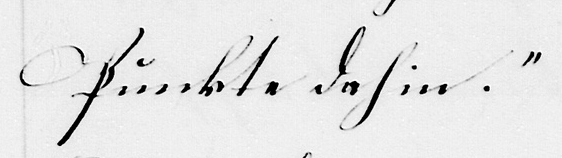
Punkte dahin.“
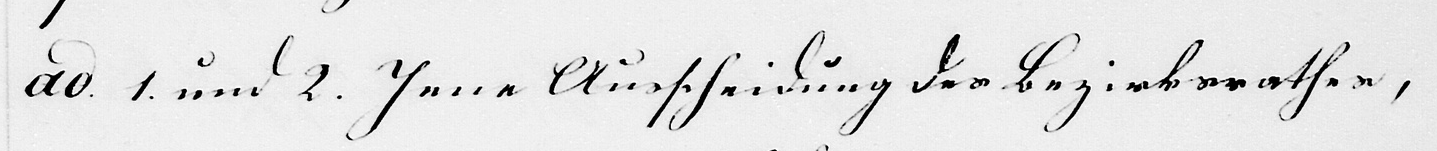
ad 1. und 2. Jene Ausscheidung des Bezirksrathes,
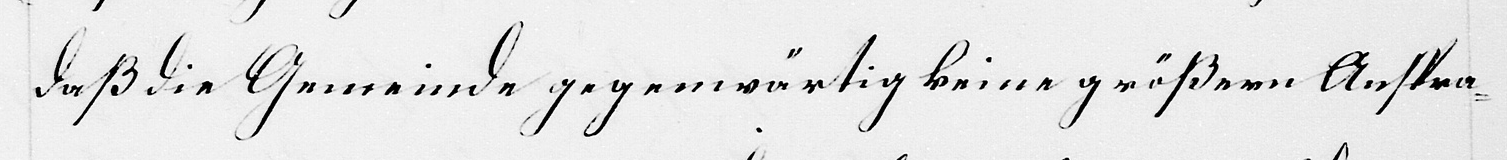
daß die Gemeinde gegenwärtig keine größern Anspra¬
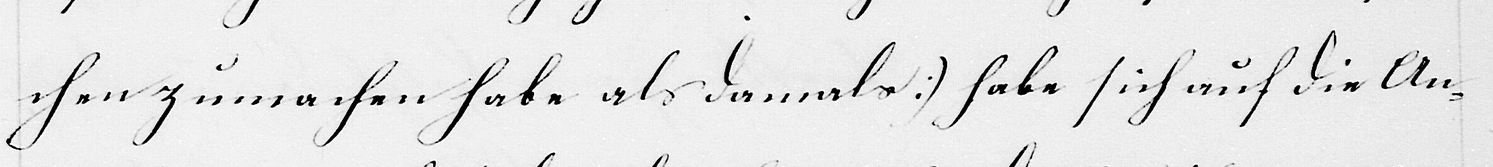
chen zu machen habe als damals:) habe sich auf die An¬
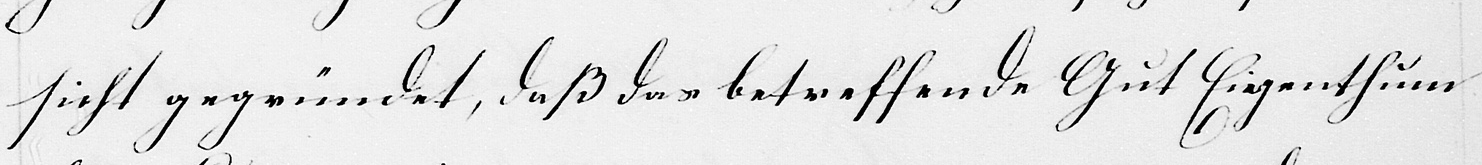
sicht gegründet, daß das betreffende Gut Eigenthum
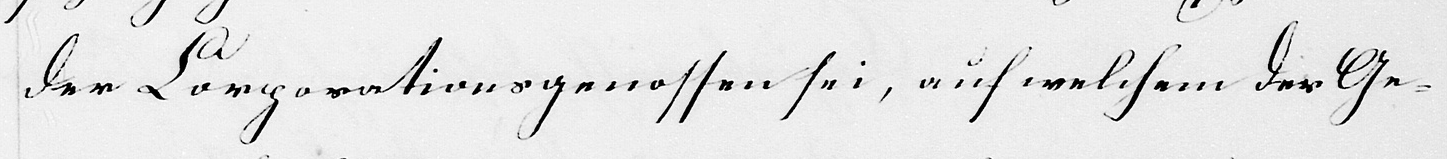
der Corporationsgenossen sei, auf welchem der Ge¬
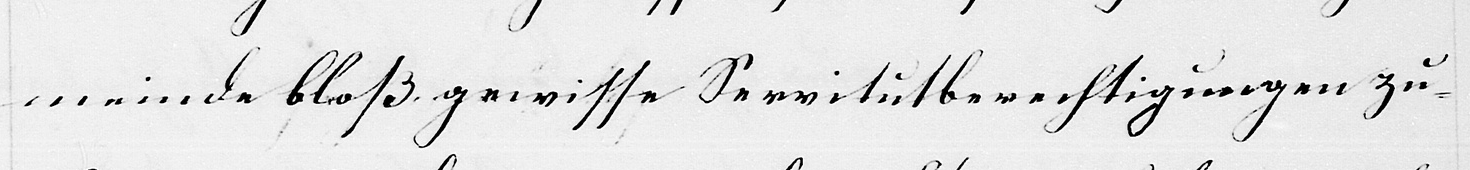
meinde bloß gewisse Servitutberechtigungen zu¬
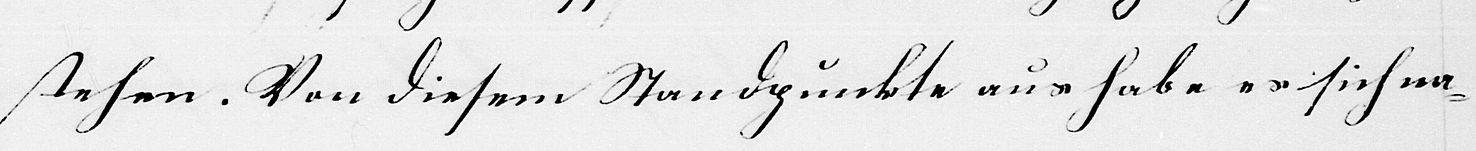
stehen. Von diesem Standpunkte aus habe es sich na¬
